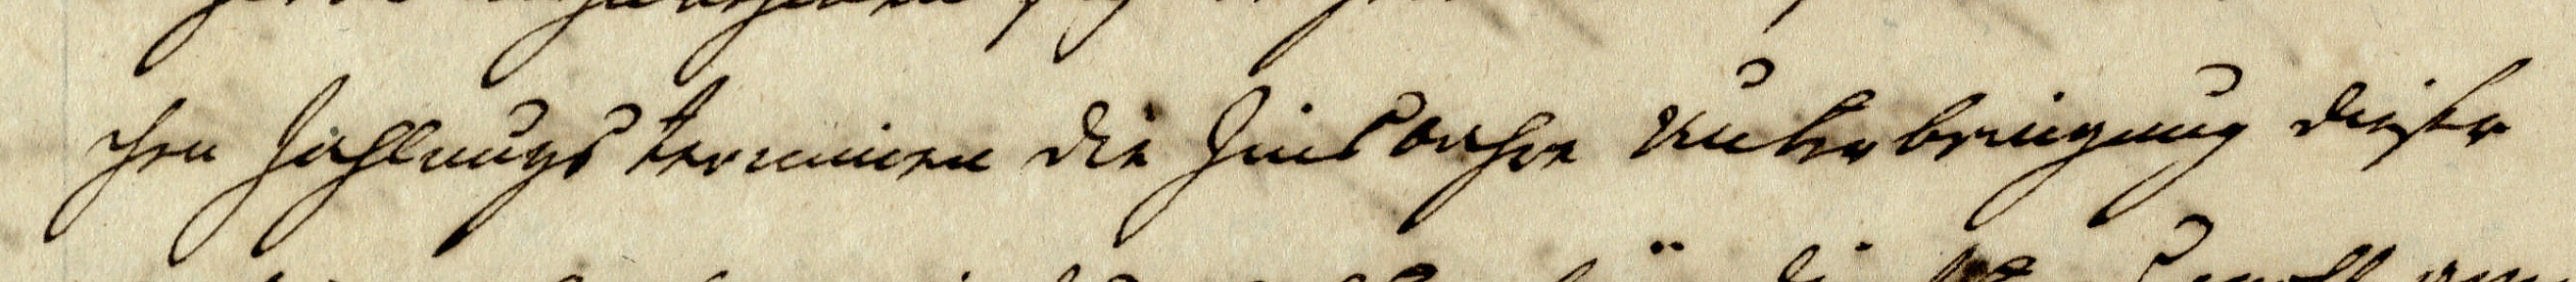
chen Zahlungs Terminen die zinsbahre Unterbringung dieser
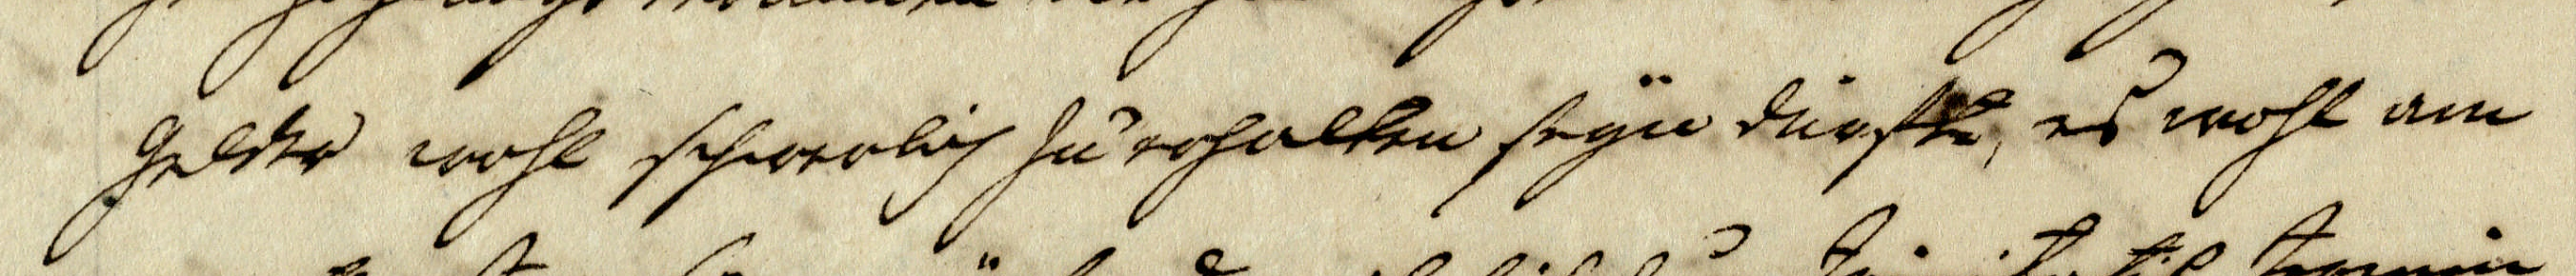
Gelder wohl schwerlich zu erhalten seÿn dürfte, es wohl am
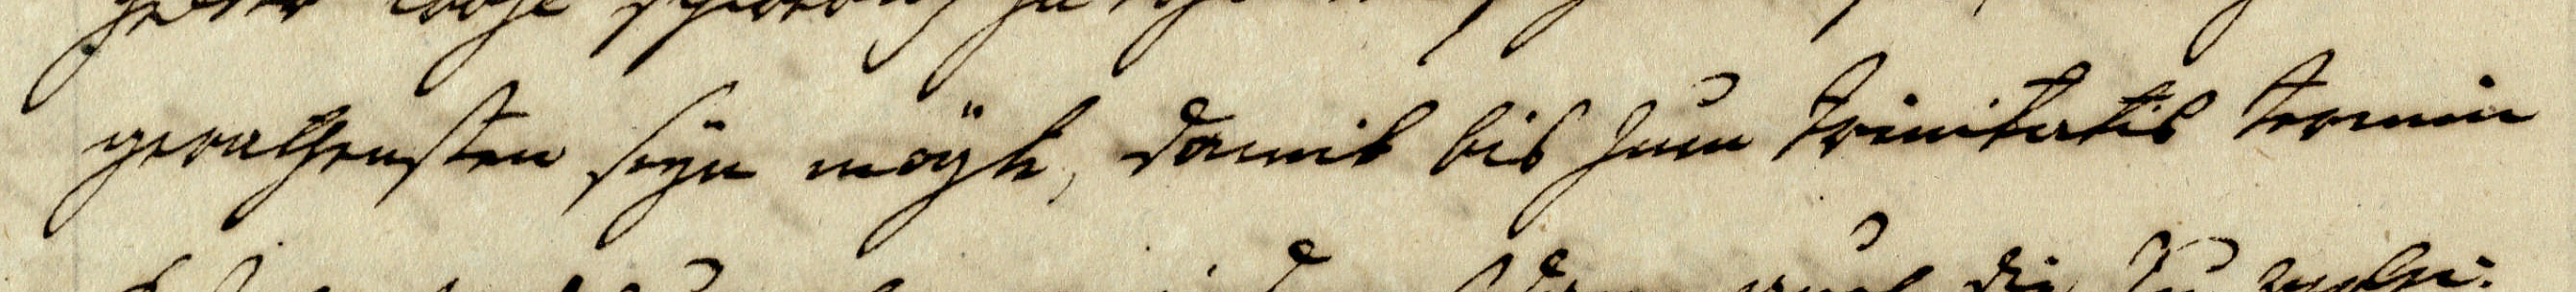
gerathensten seÿn mögte, damit bis zum Trinitatis Termin
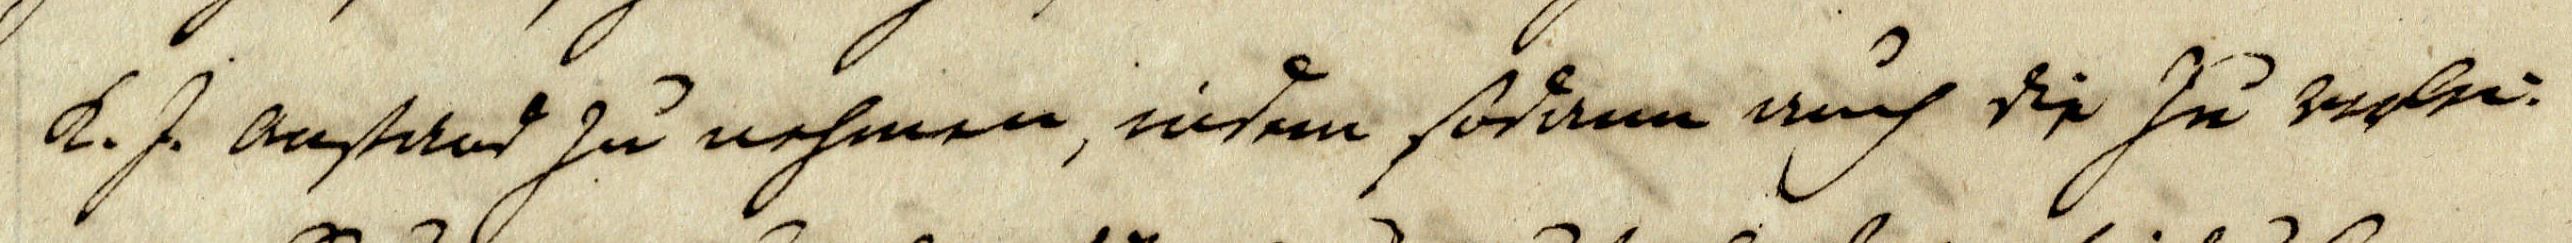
k. J. Anstand zu nehmen, indem sodann auch die zu verlei¬
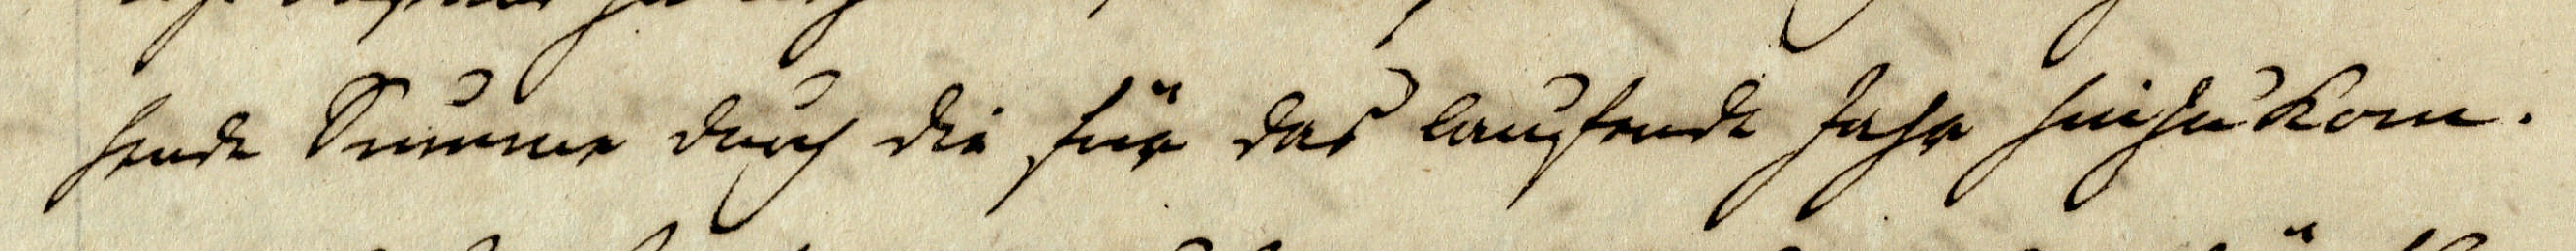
hende Summe durch die für das laufende Jahr hinzukom¬
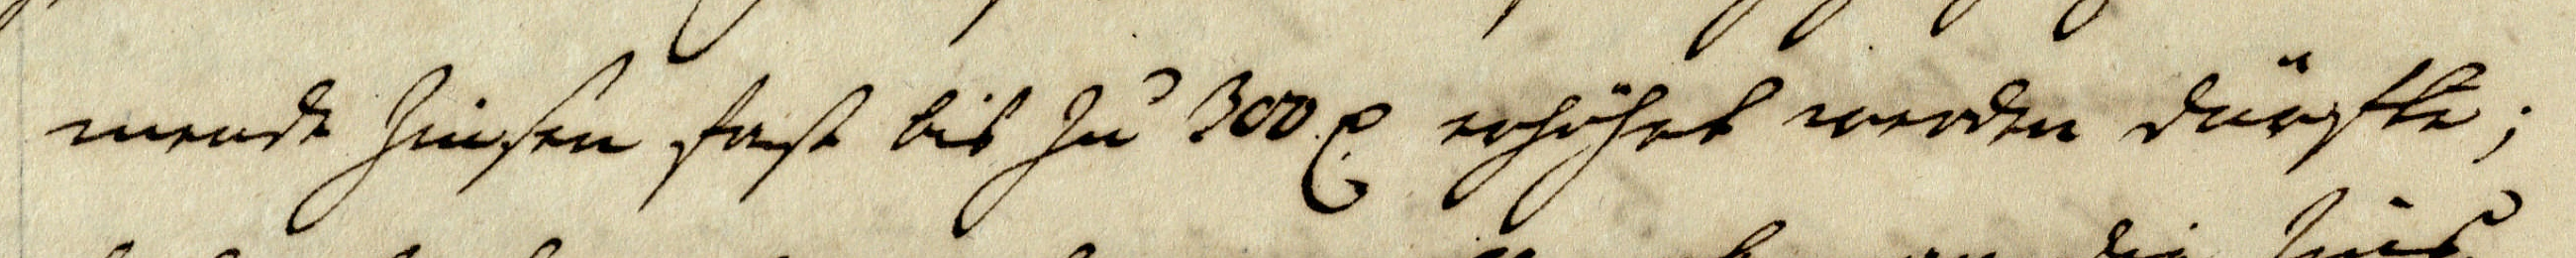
mende Zinsen fast bis zu 300 l. erhöhet werden dürfte;
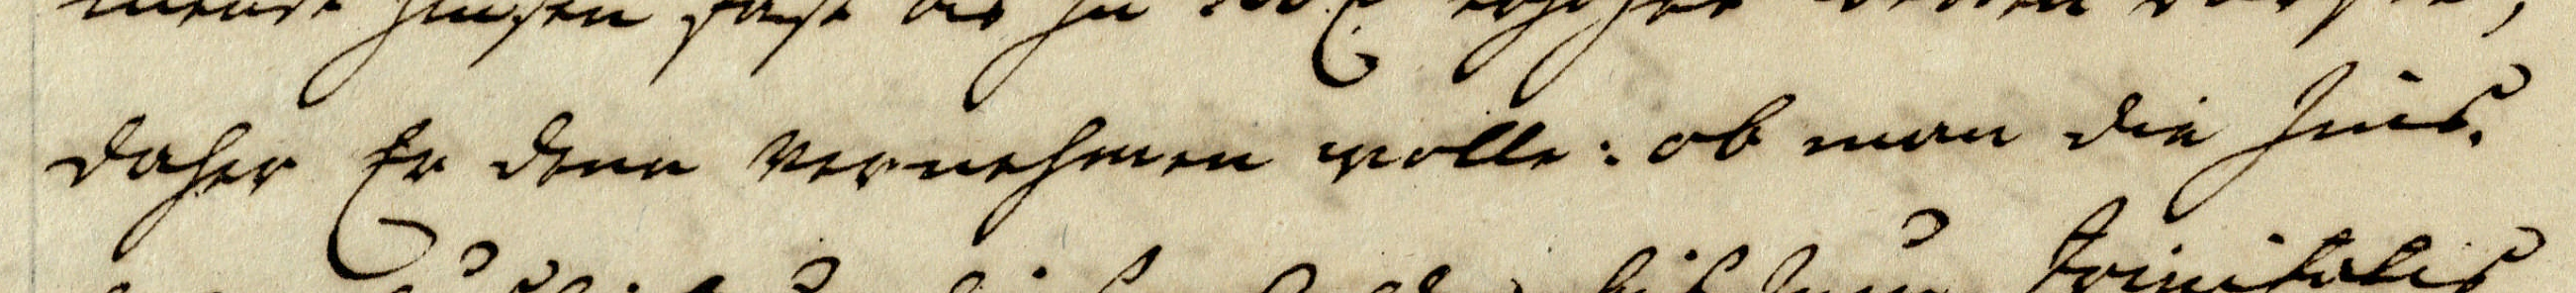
daher Er denn vernehmen wolle: ob man die zins¬
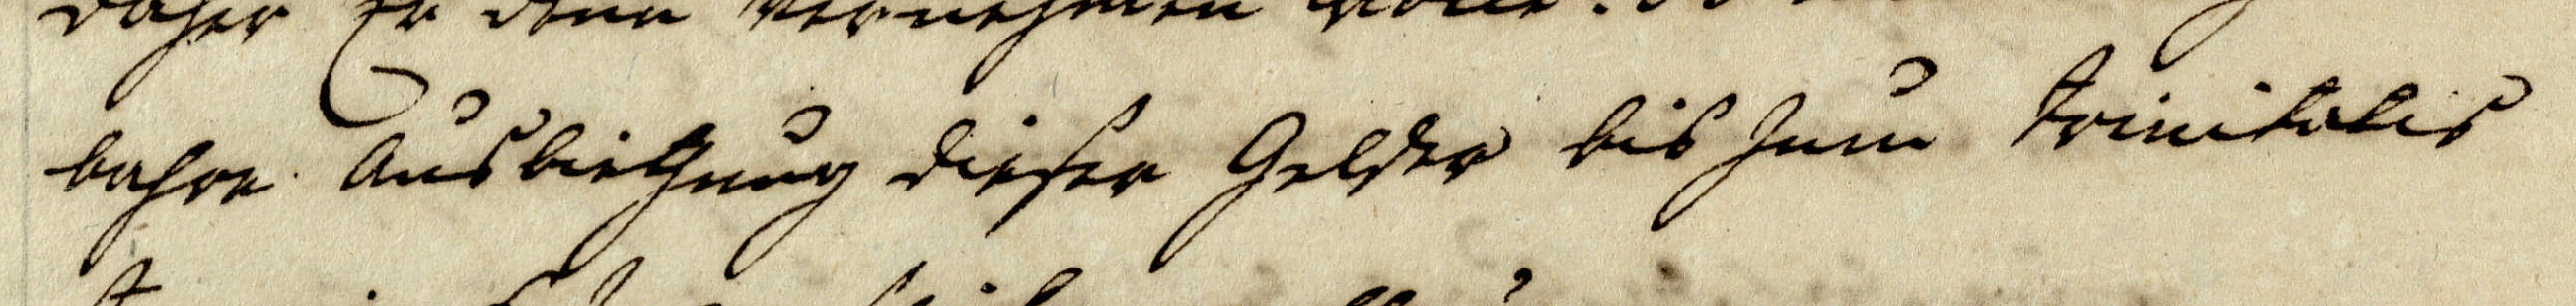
bahre Ausbiethung dieser Gelder bis zum Trinitatis
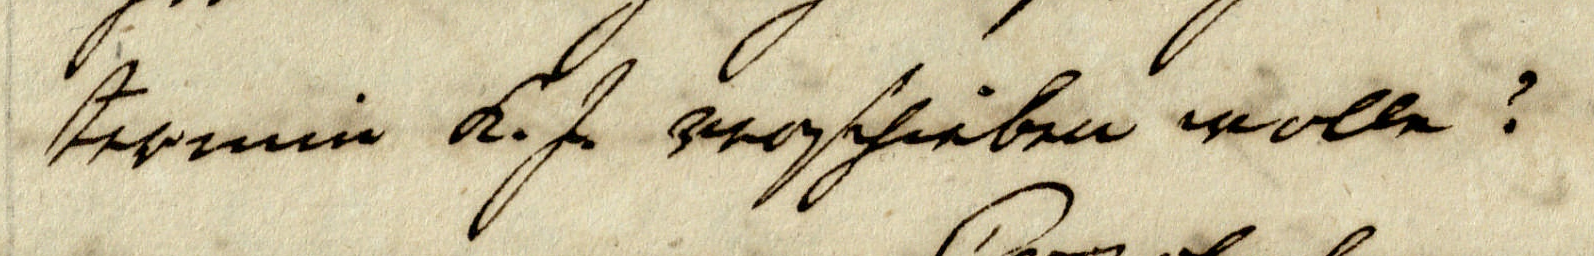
Termin k. J. verschieben wolle?
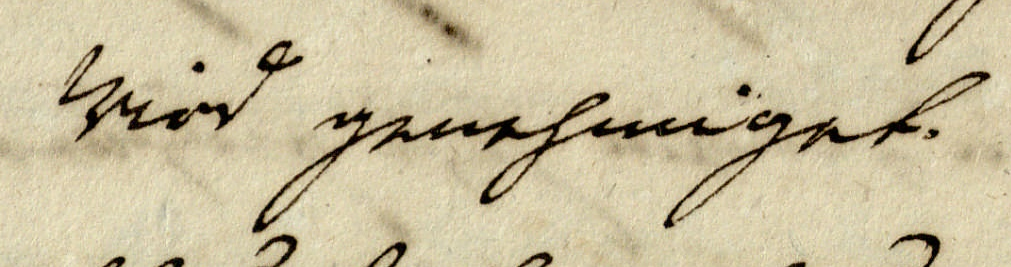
Wird genehmiget.
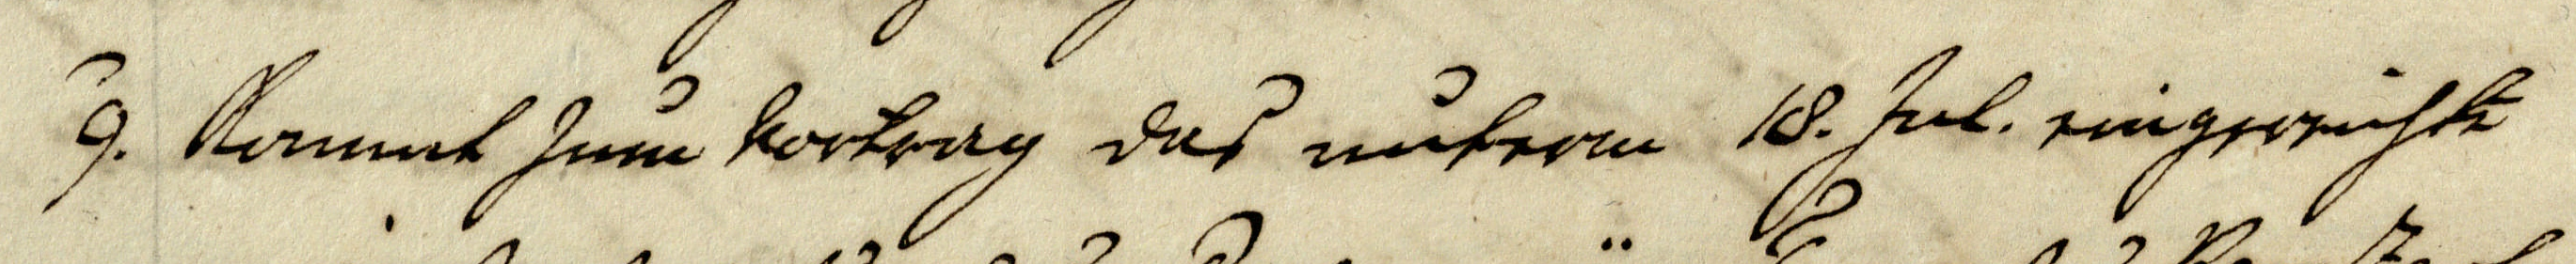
9. Kommt zum Vortrag das unterm 18. Jul. eingereichte
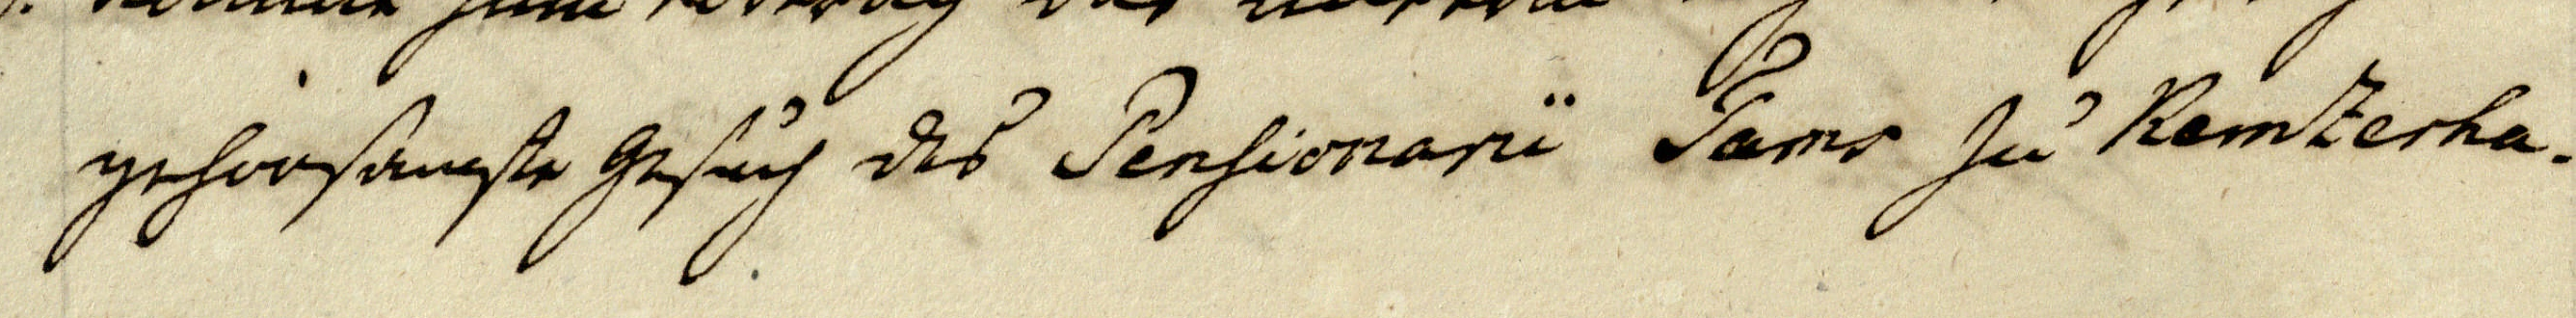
gehorsamste Gesuch des Pensionari Tams zu Kemzerha¬
